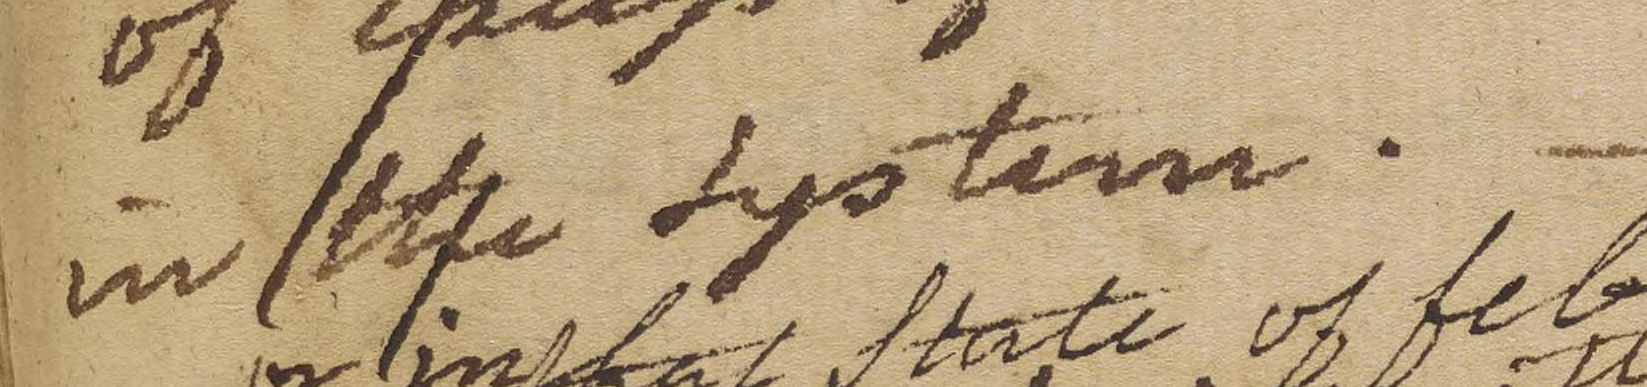in the System.
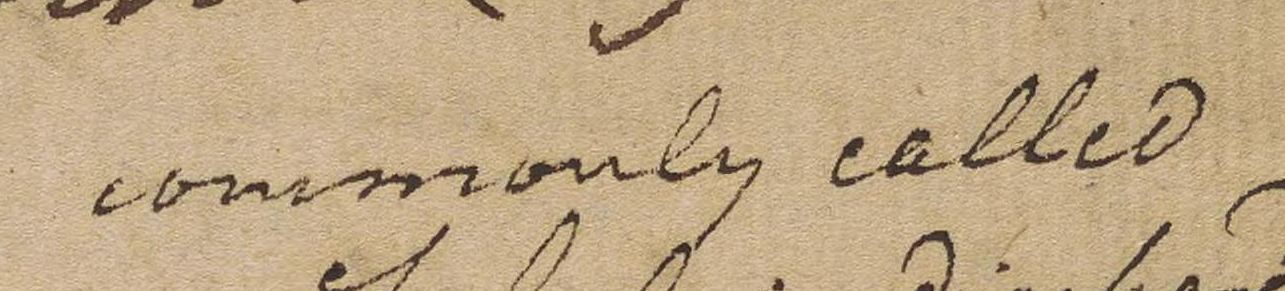commonly called
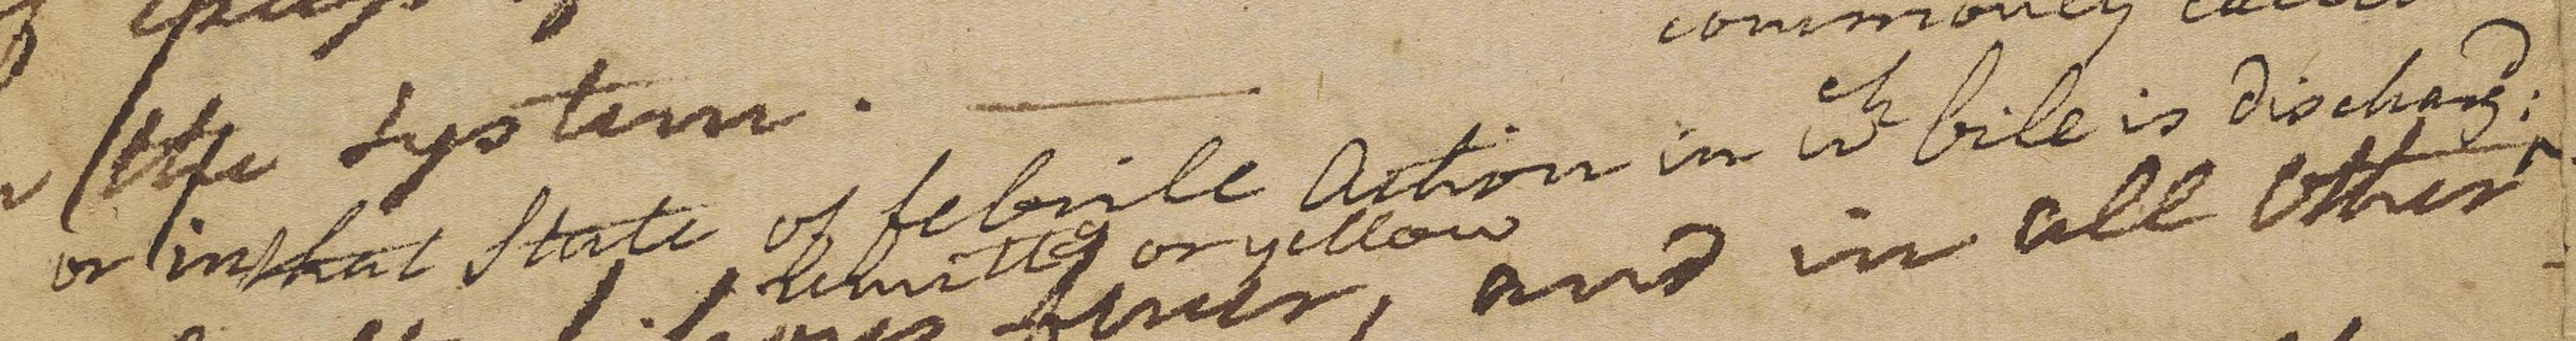or in that State of febrile Action in w^ch bile is discharg^d
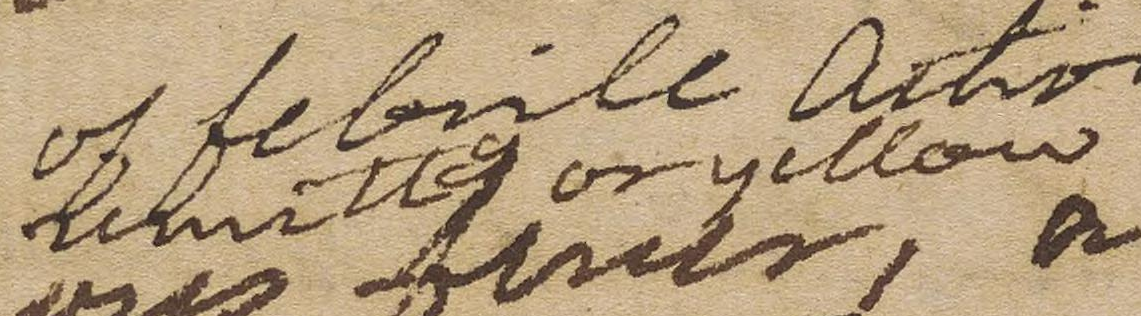remitt^g or yellow
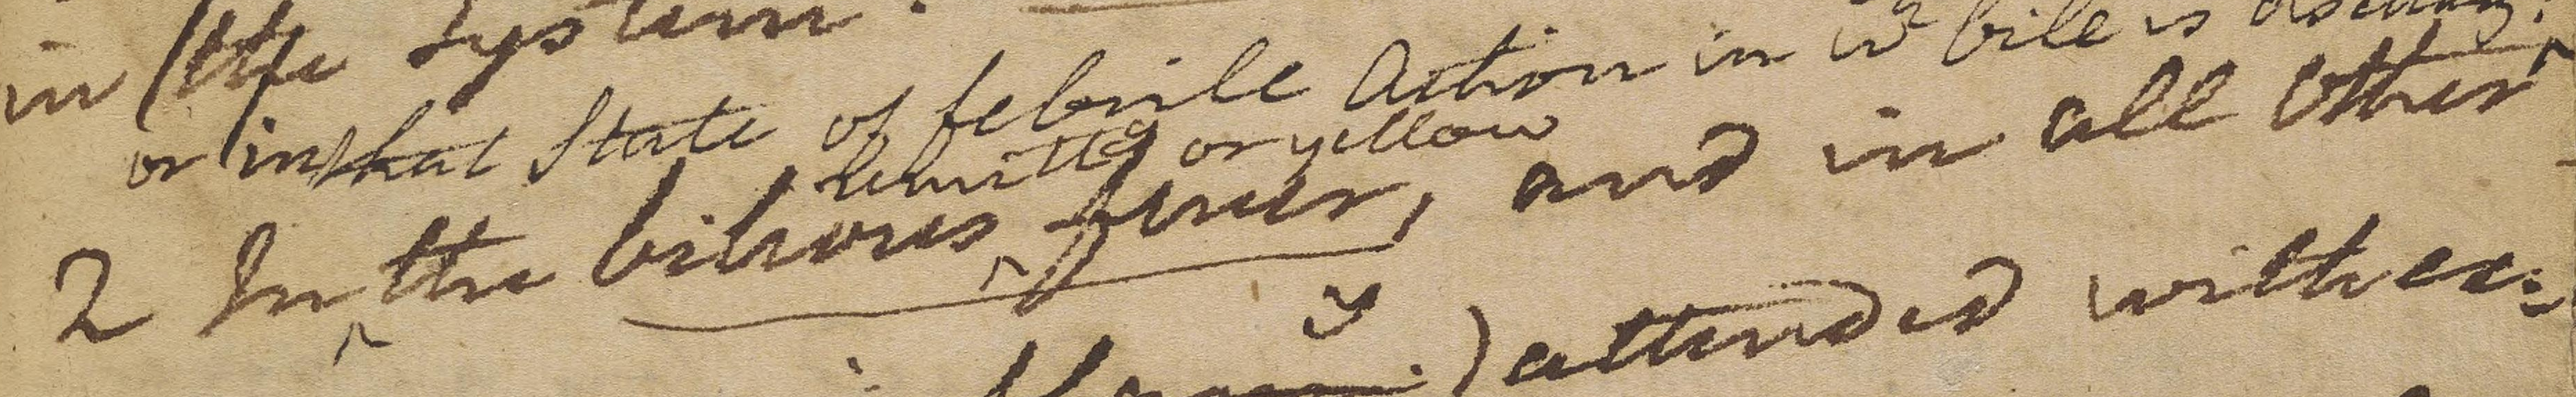2 In ^ the bilious ^ fever, and in all other
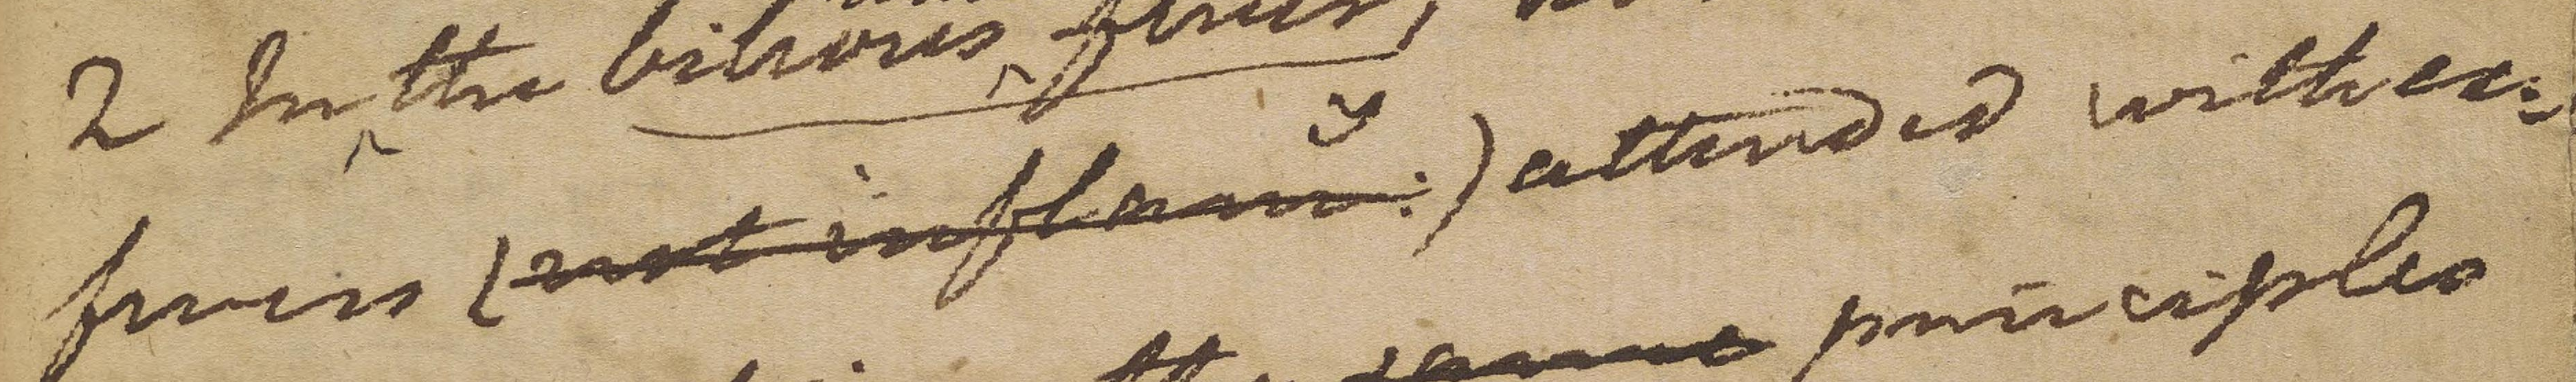fevers ([not inflam^y:]) attended with ex-
